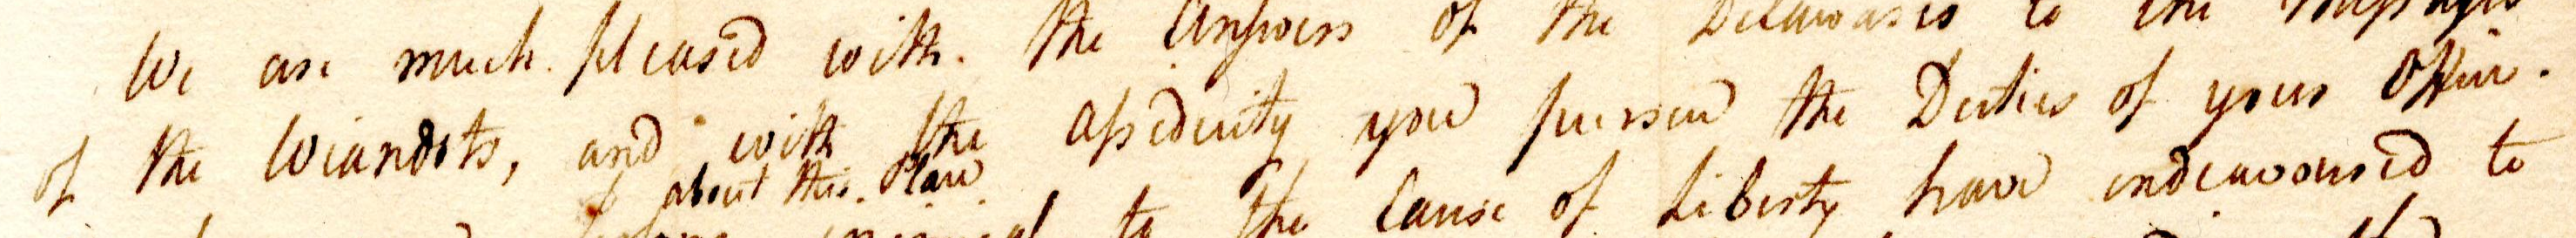of the Wiandots, and with the assiduity you pursue the Duties of your Office.
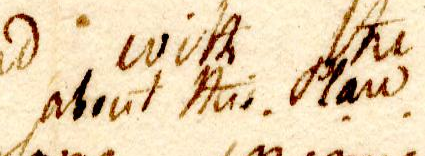about this Place
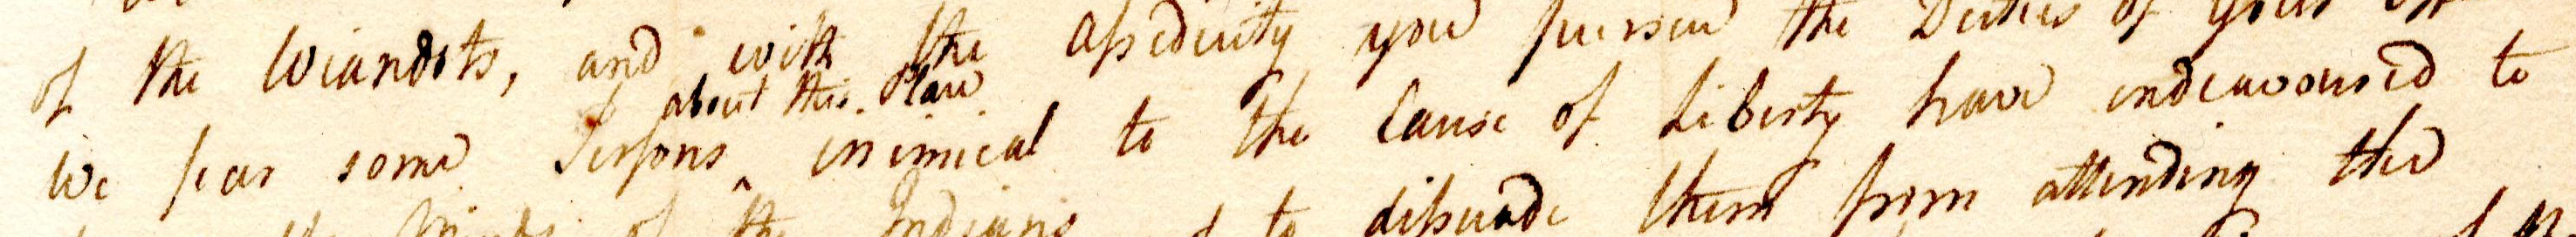We fear some Persons ^ inimical to the Cause of Liberty have endeavoured to
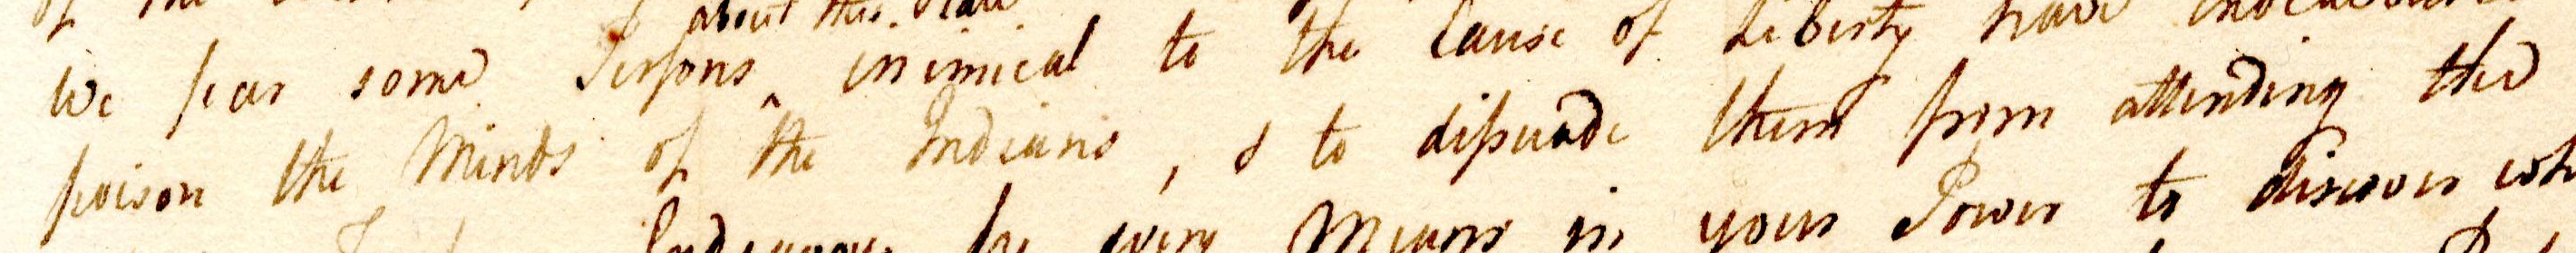poison the Minds of the Indians, & to dissuade them from attending the
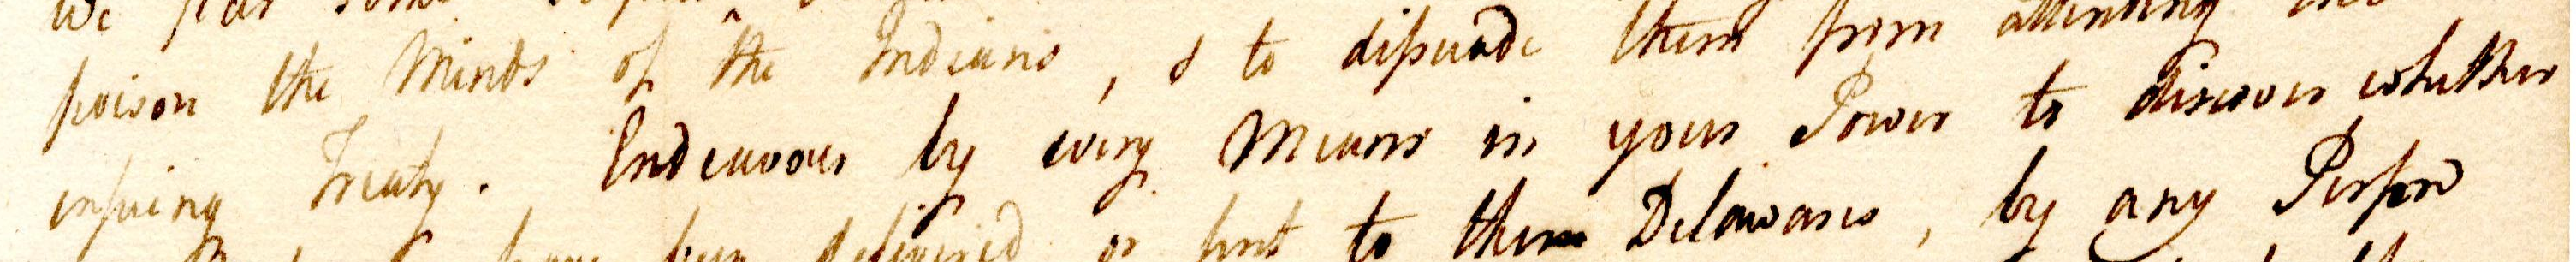insuing Treaty. Endeavours by every means in your Power to discover whether
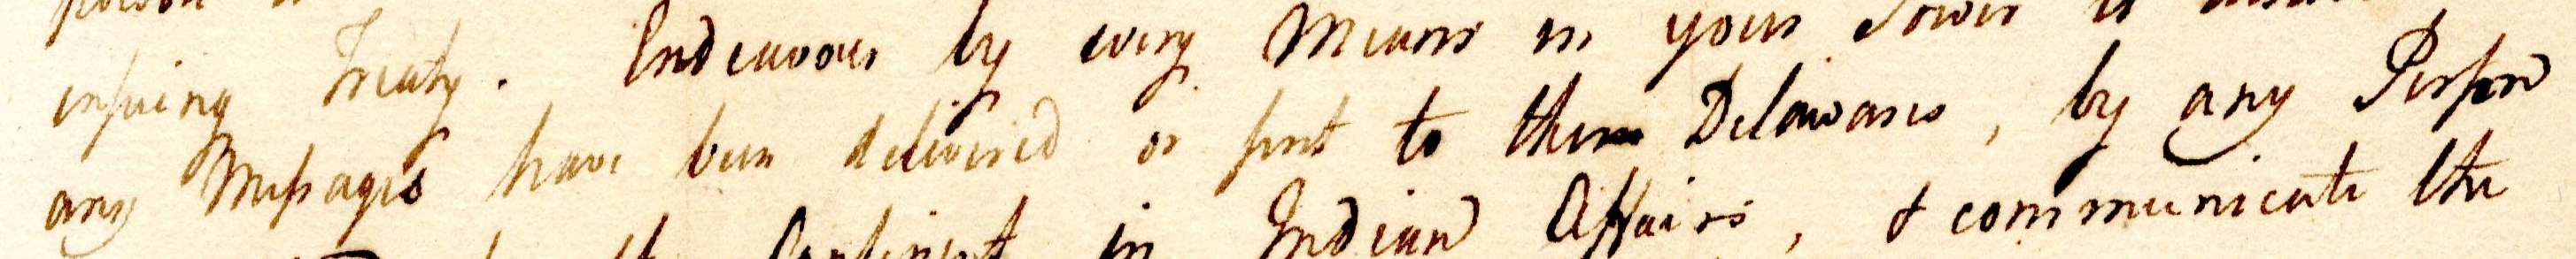any Messages have been delivered or sent to the Delawares, by any Person
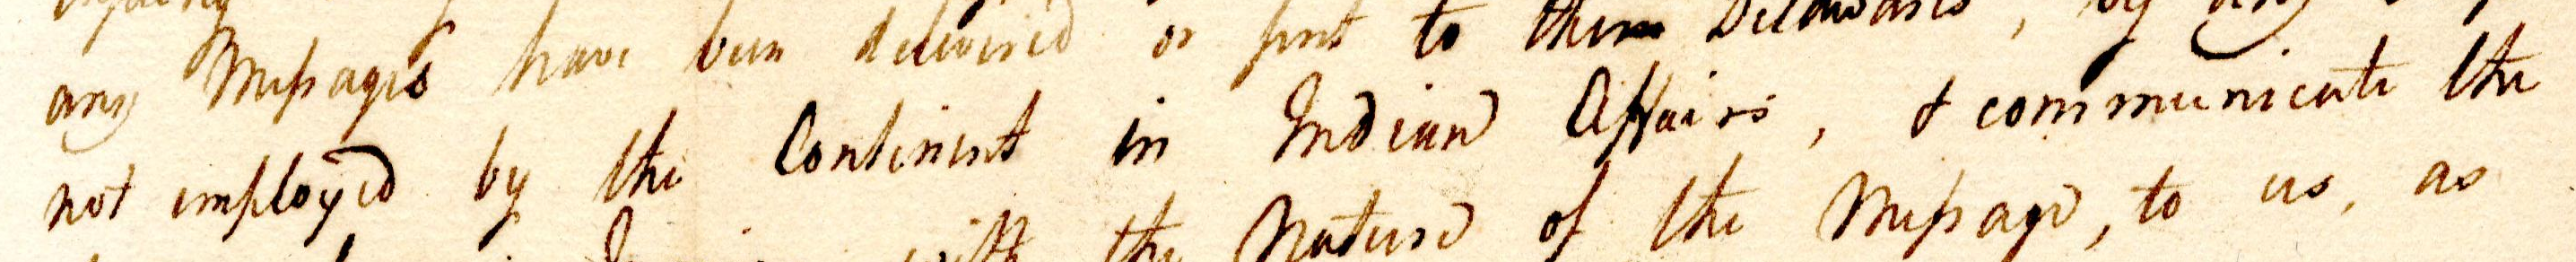not employed by the Consent in Indian Affairs, & communicate the
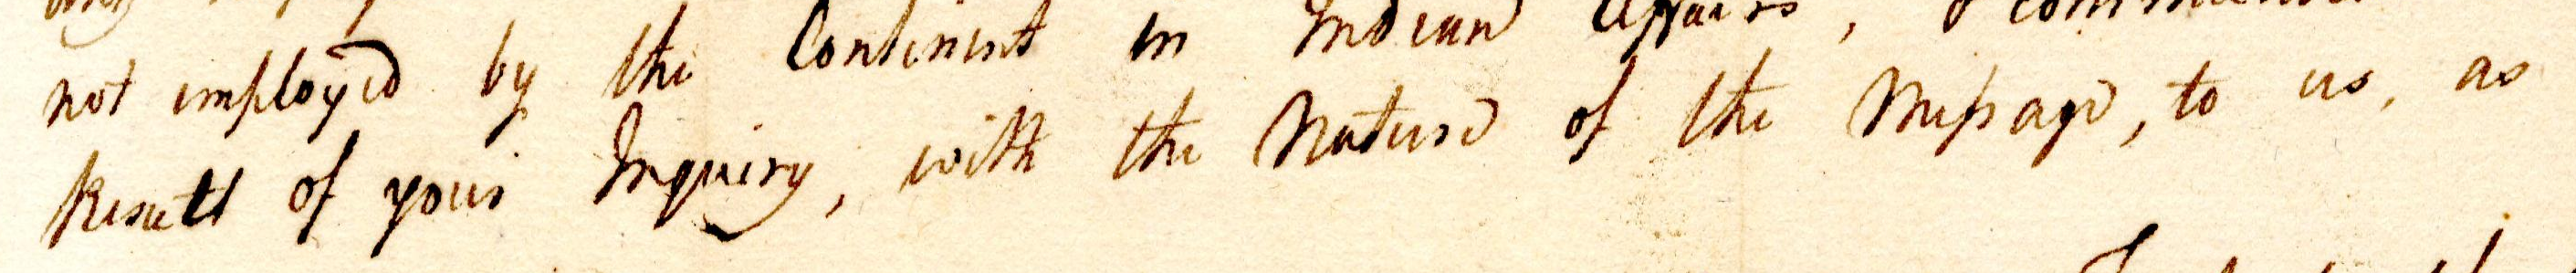Result of your Inquiry, with the Nature of the message, to us, as
